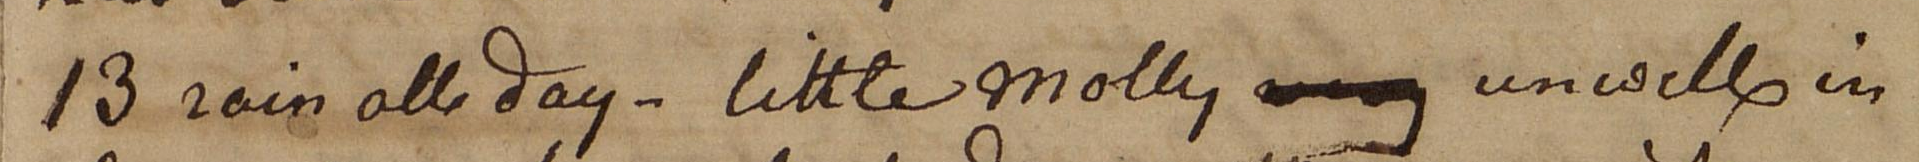13 rain all day- little Molly [very] unwell in
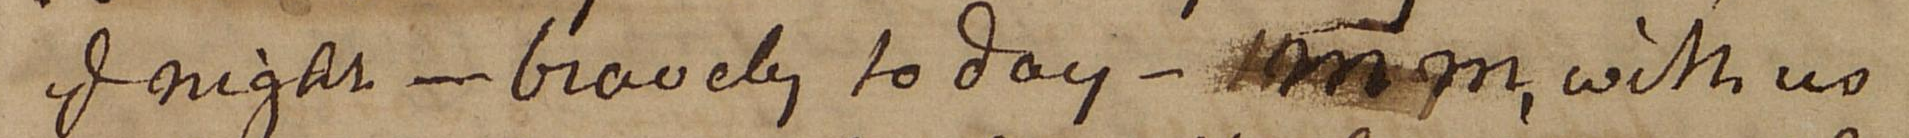y^e night- bravely to day- m m. with us
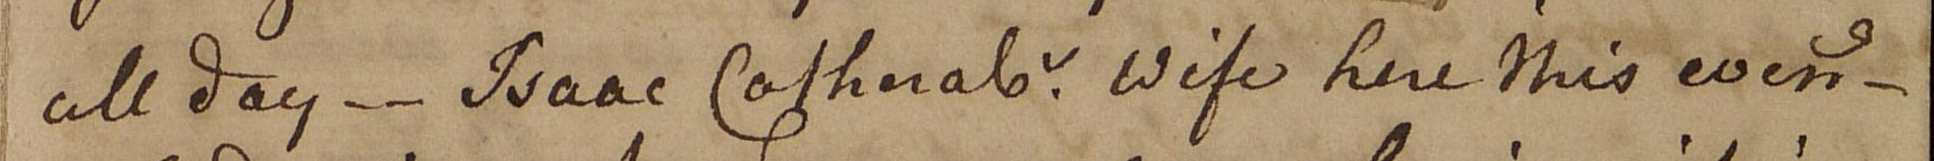all day- Isaac Catheral^s. Wife here this even^g-
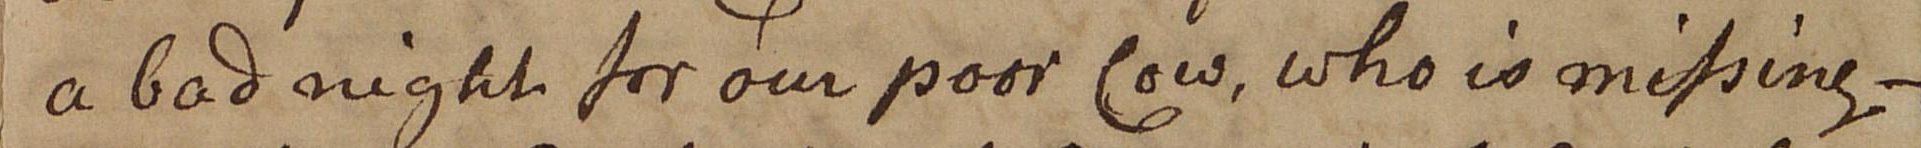a bad night for our poor Cow, who is missing-
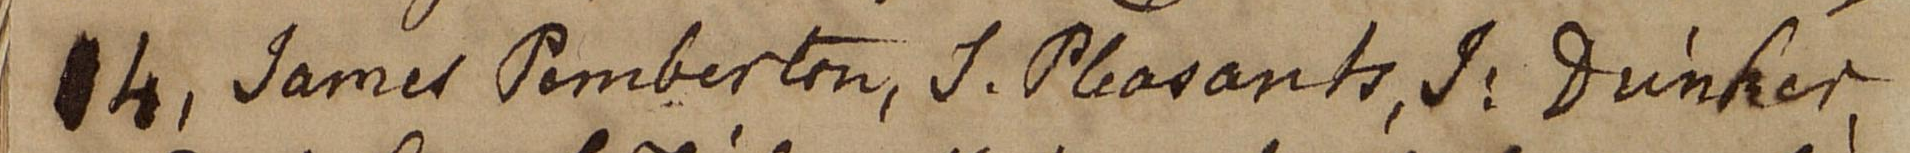14, James Pemberton, S. Pleasants, I: Drinker,
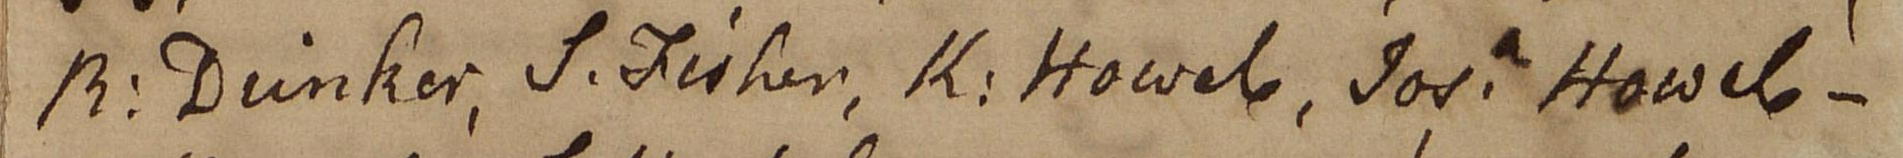R: Drinker, S. Fisher, K: Howel, Jos^a. Howel-
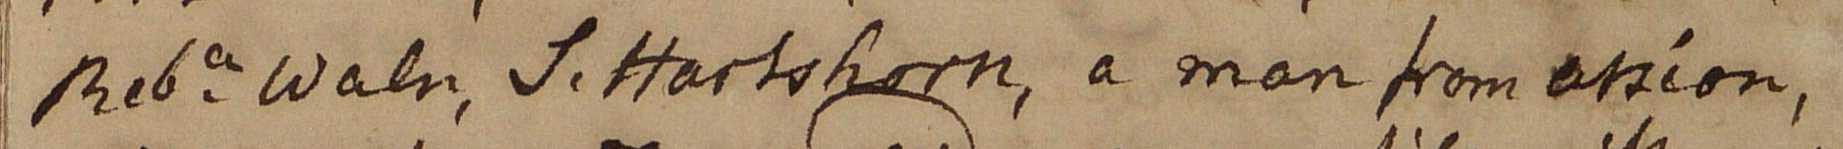Reb^a. Waln, S. Hartshoon, a man from atsion,
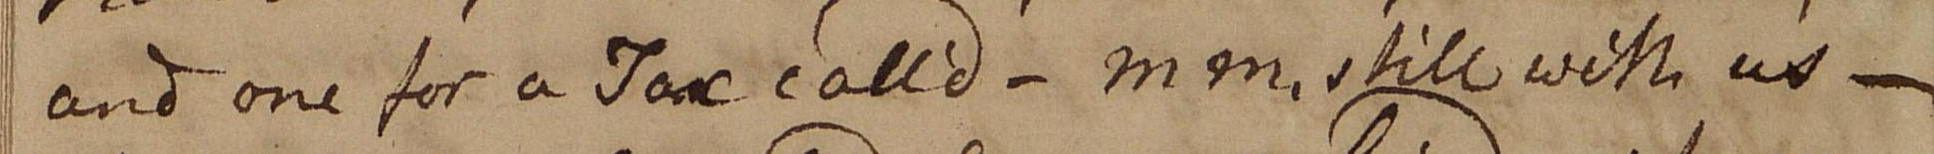and one for a Tax call'd- m m, still with us-
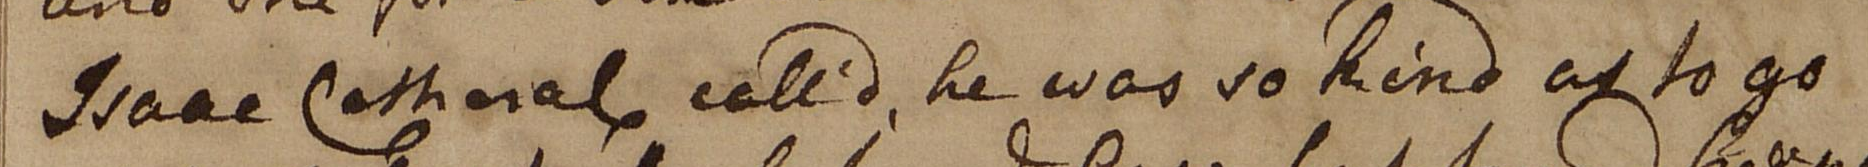Isaac Catheral call'd, he was so kind as to go
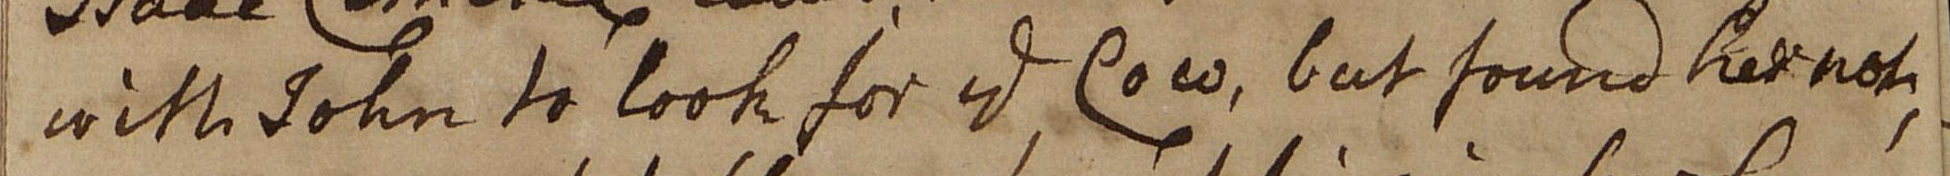with John to look for y^e Cow, but found her not,
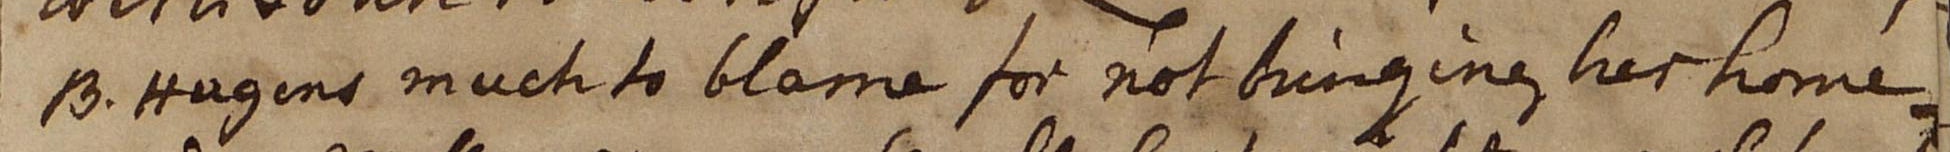B. Hugens much to blame for not bringing her home
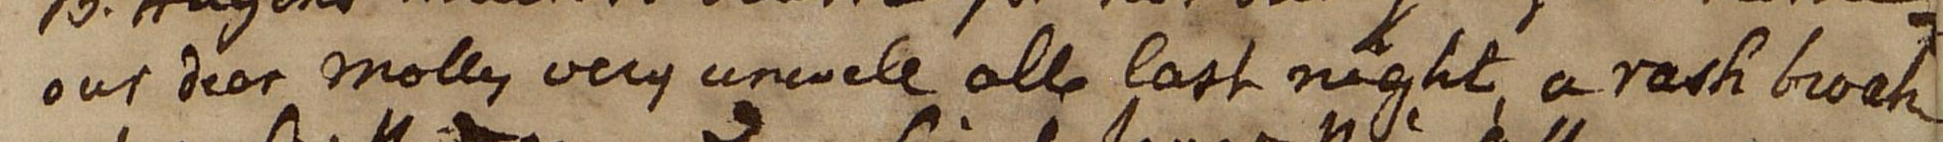our dear Molly very unwell all last night, a rash broak
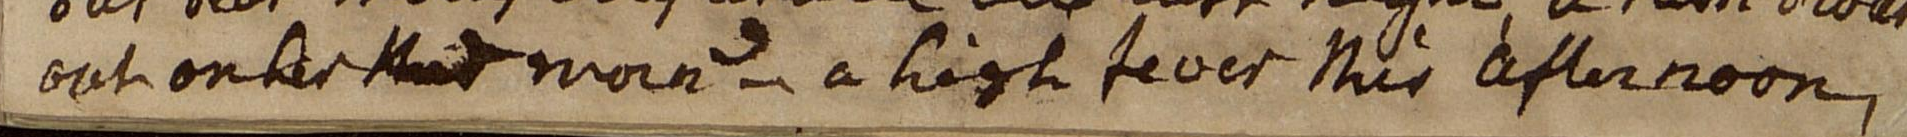out on her that morn^g- a high fever this afternoon,
